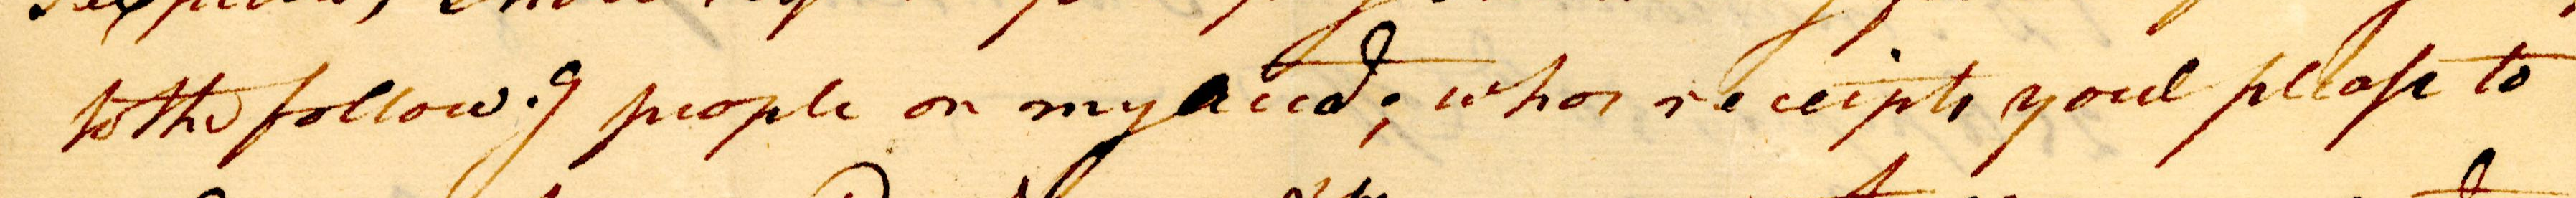to the follow.^g people on my acco^t., whos receipts youl please to
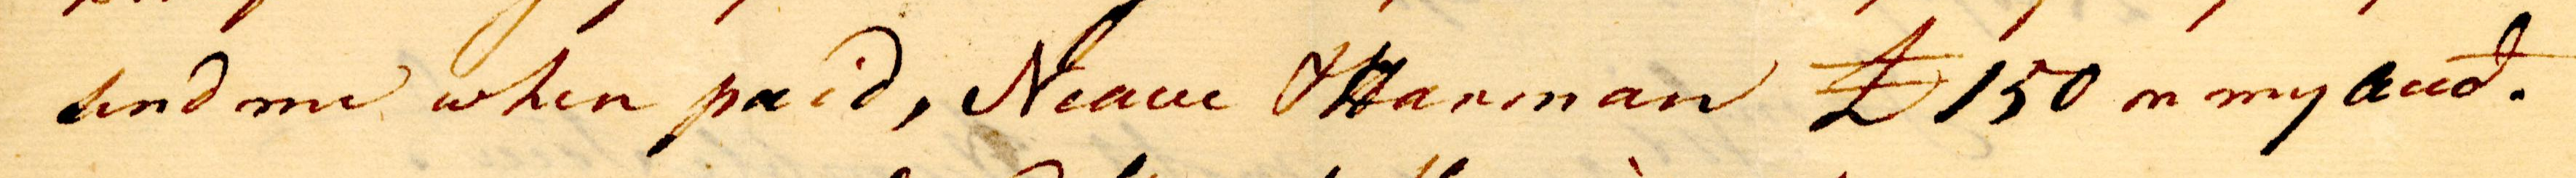send me when paid, Neave & Harman £150 on my acco^t.
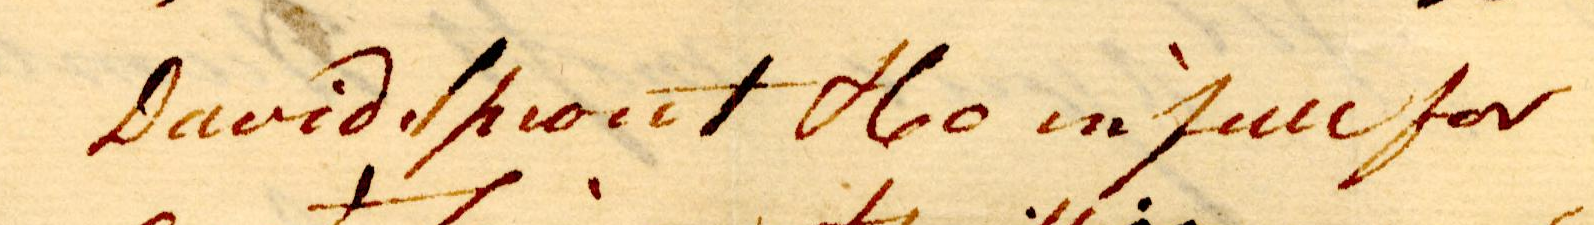David Sprout &Co in full for
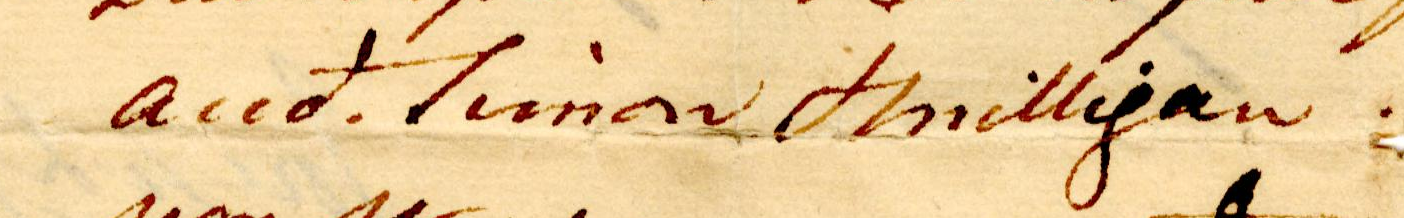acco^t. Simon & Milligan
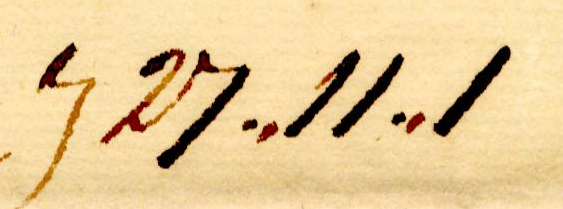927..11..1
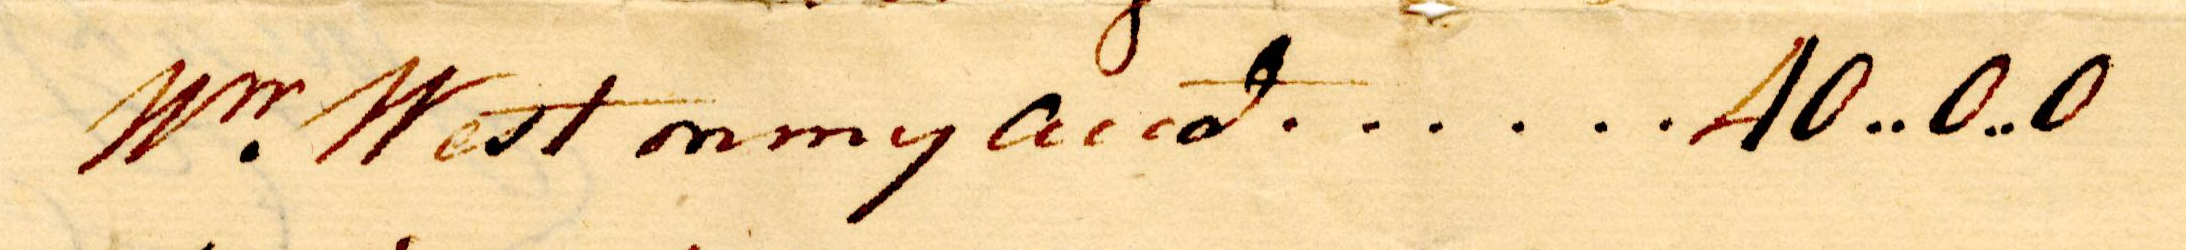M^r. West on my acco^t . . . . . . 40..0..0
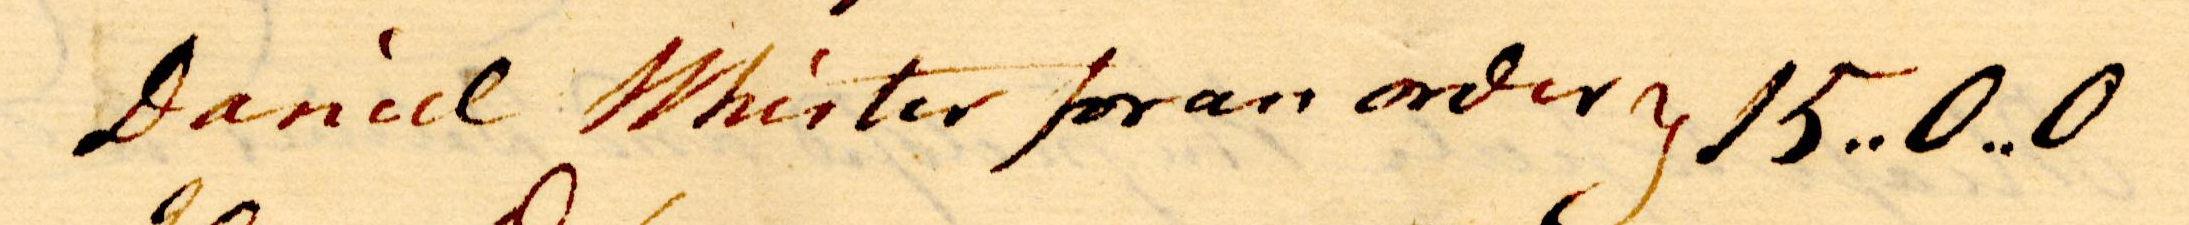Daniel Whister for an order 15..0..0
